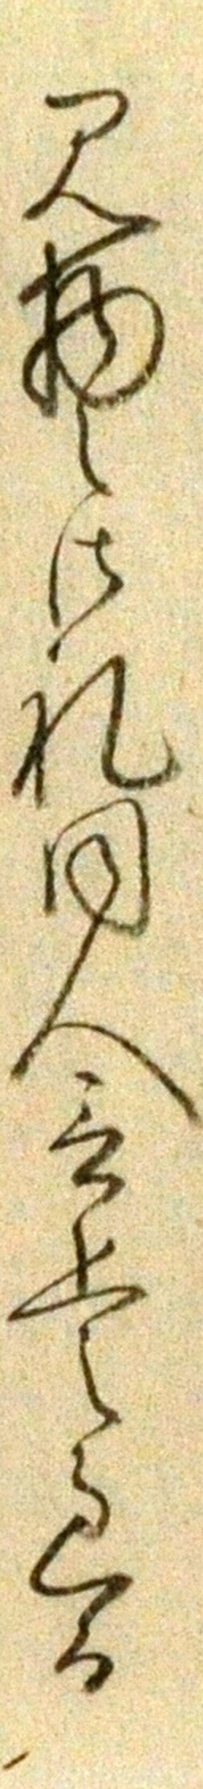見物之御礼同人言上之過而
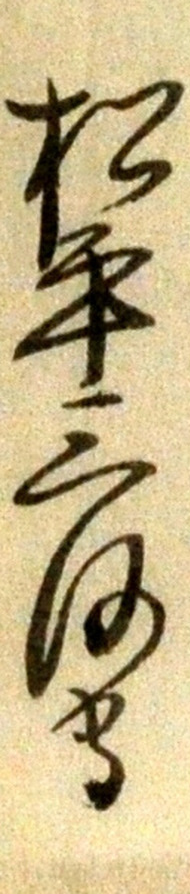松平三河守
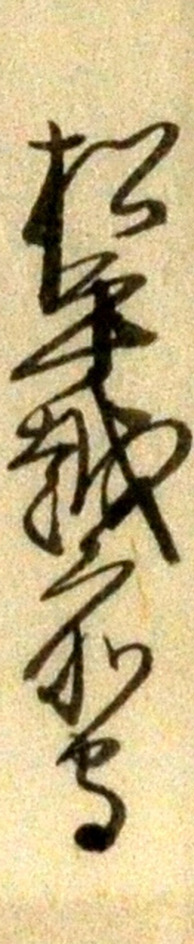煩松平越前守
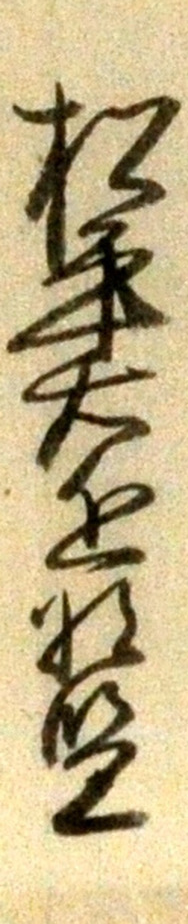松平右近将監
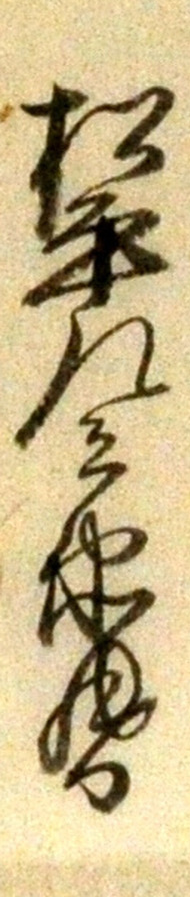煩松平左兵衛督
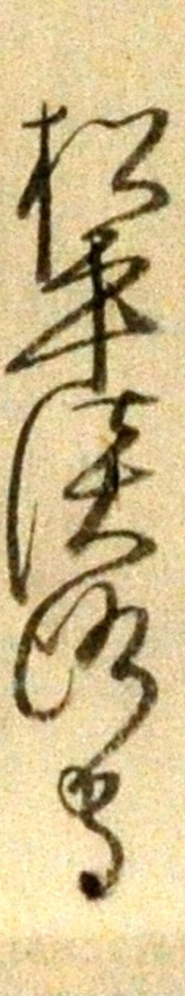松平淡路守
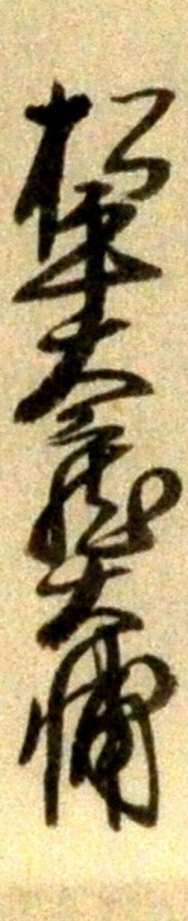松平大蔵大輔
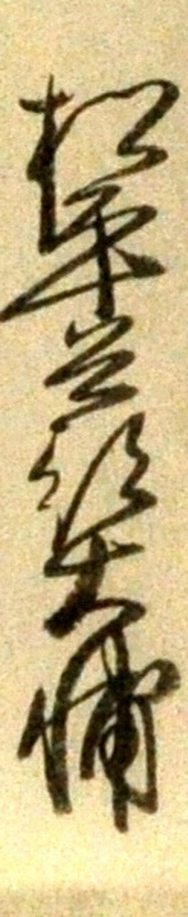煩松平兵部大輔

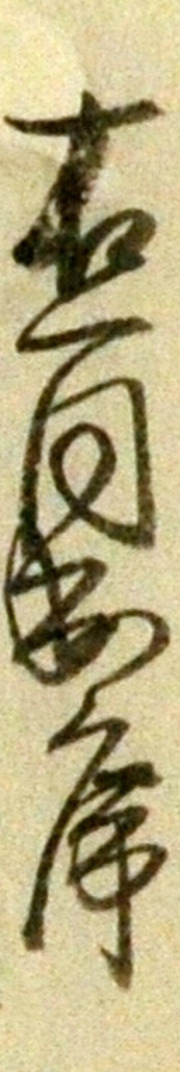右一同出席
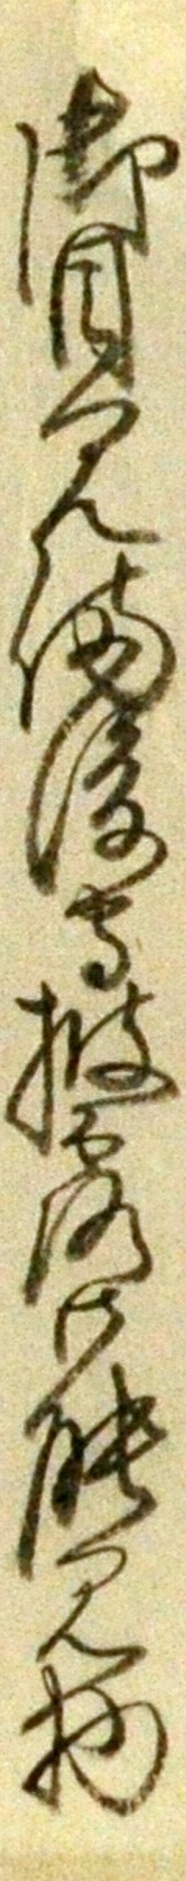御目見備後守披露御能見物
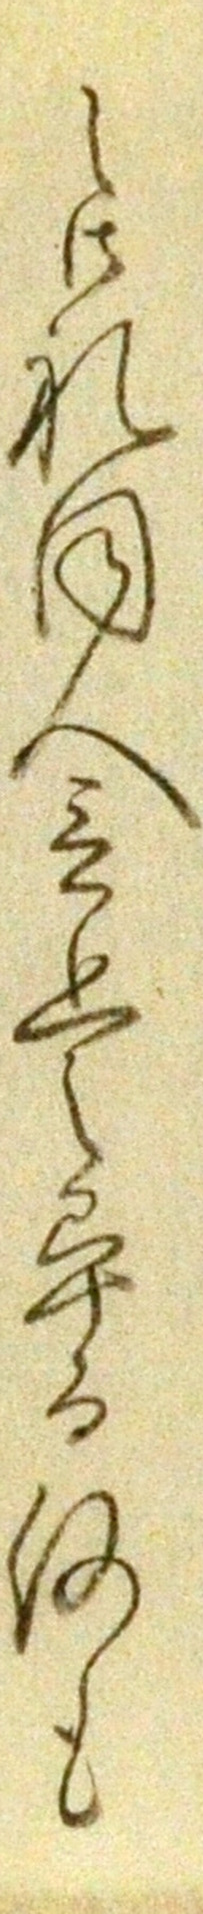之御礼同人言上之畢而何も
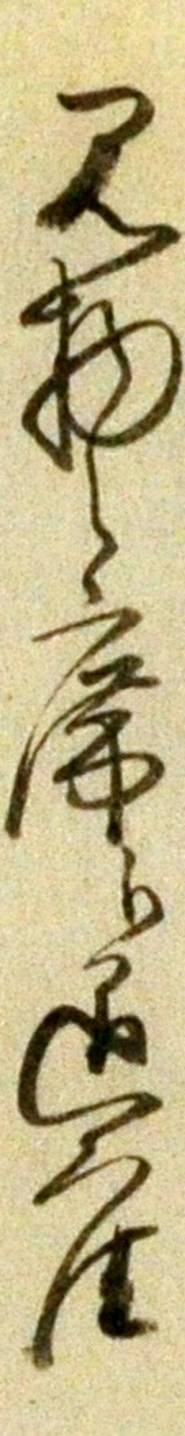見物之席え退座
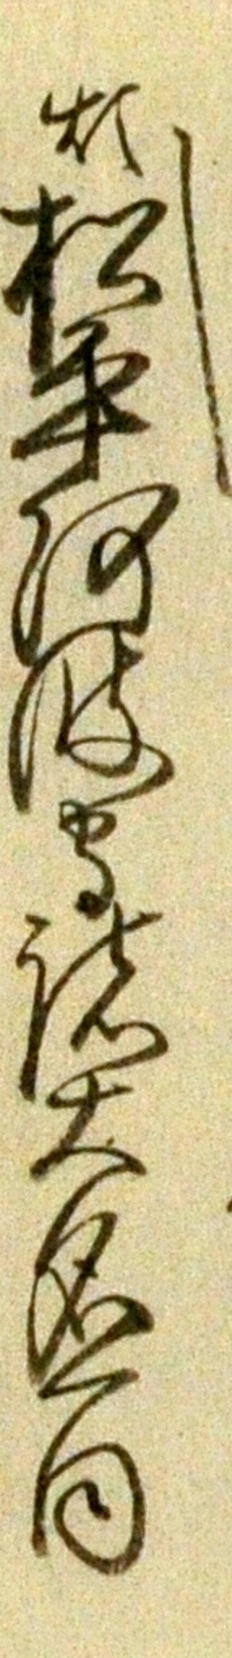煩松平阿波守諸大名一同
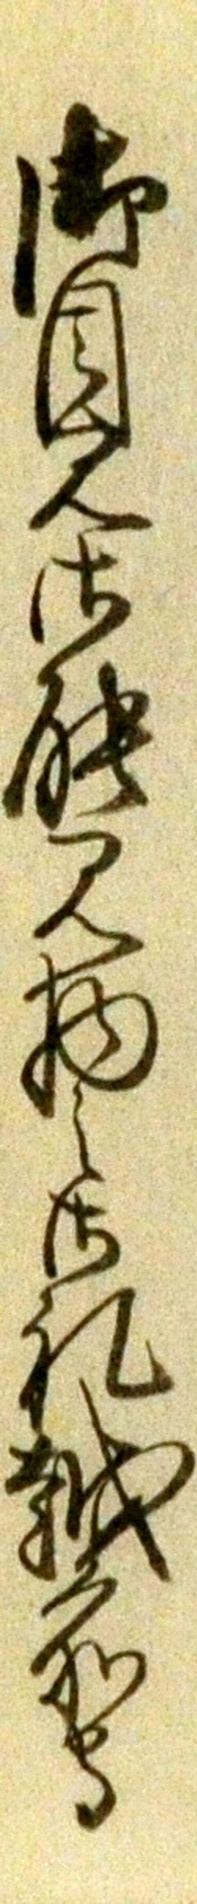御目見御能見物之御礼越前守
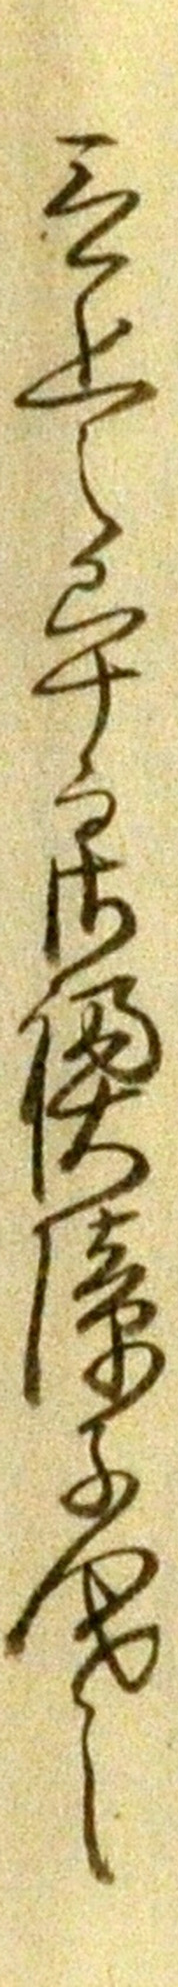言上之畢而御襖障子閉之
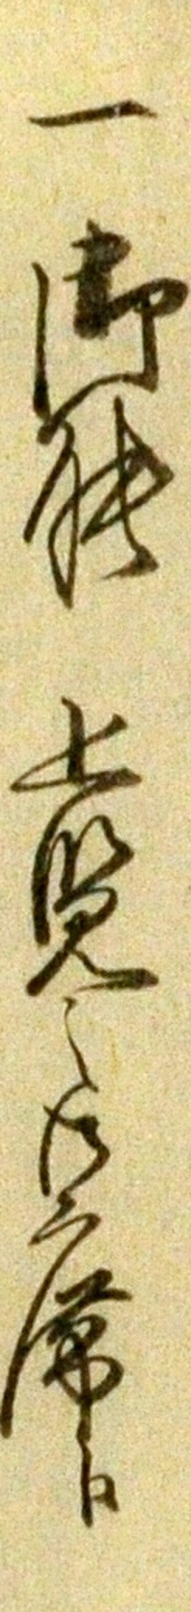一御能上覧之御席え
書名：御馳走御能ノ節ノ留外
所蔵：伊那市立高遠町図書館・合同会社AMANE
